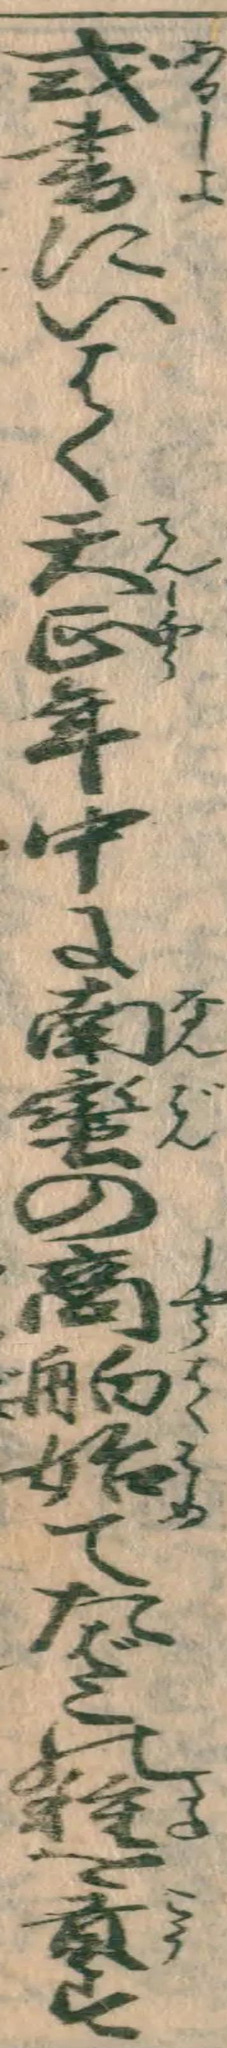或書にいはく天正年中に南蛮の商舶始てたばこの種を貢す
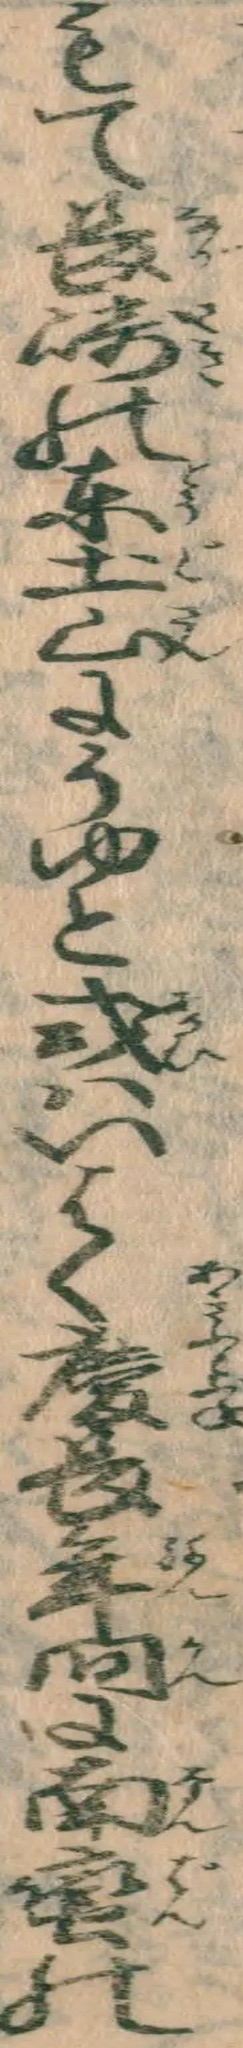もて長崎の東土山にうゆと或はいはく慶長年間に南蛮の
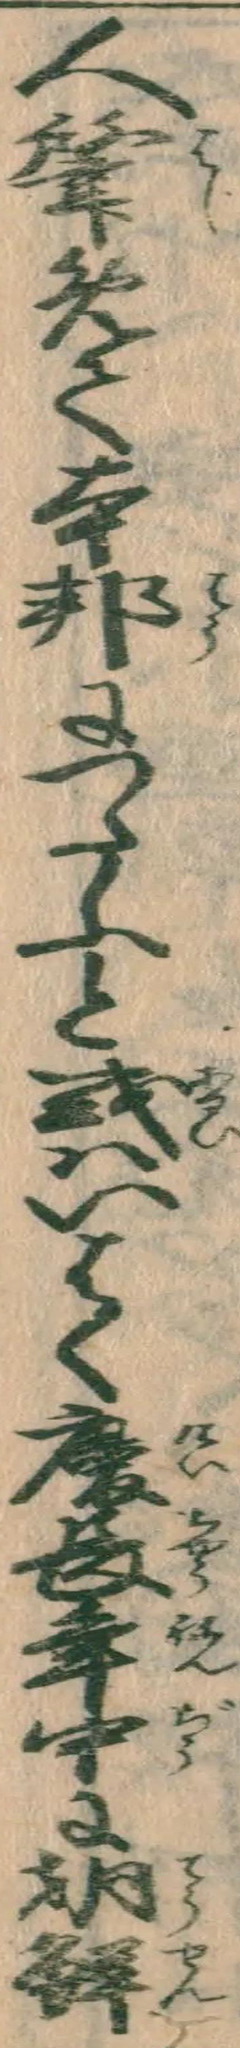人肇めて本邦につたふと或はいはく慶長年中に朝鮮
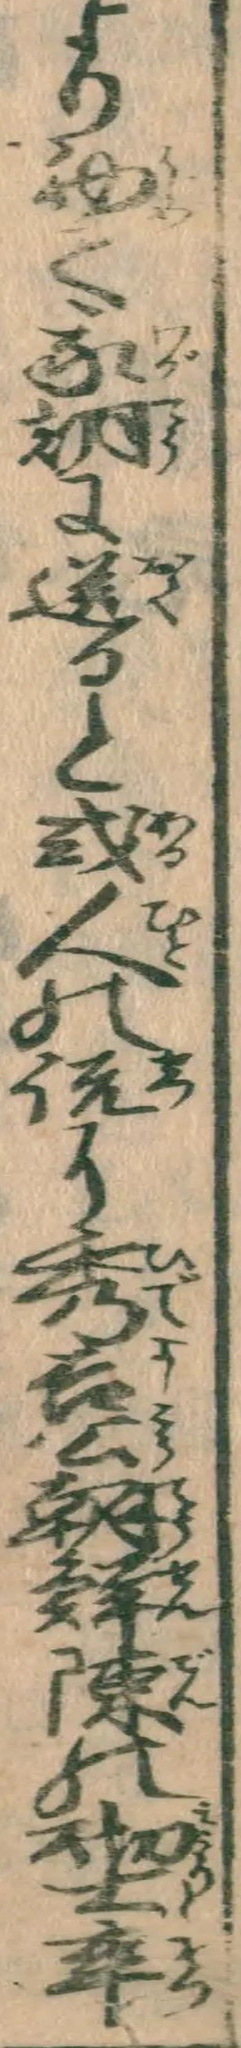より初て我朝に送ると或人の説に秀吉公朝鮮陣の砌士卒
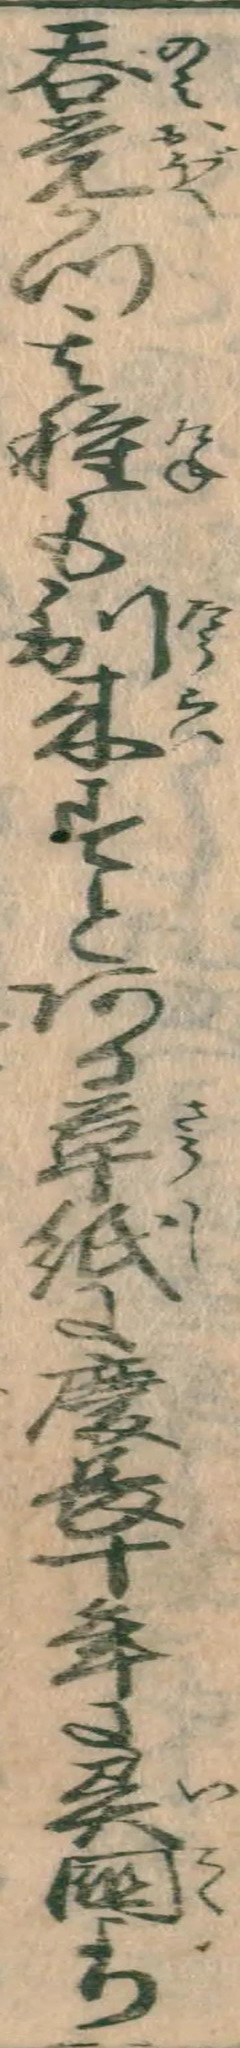呑覚かつ其種も到来すとある草紙に慶長十年に異国より
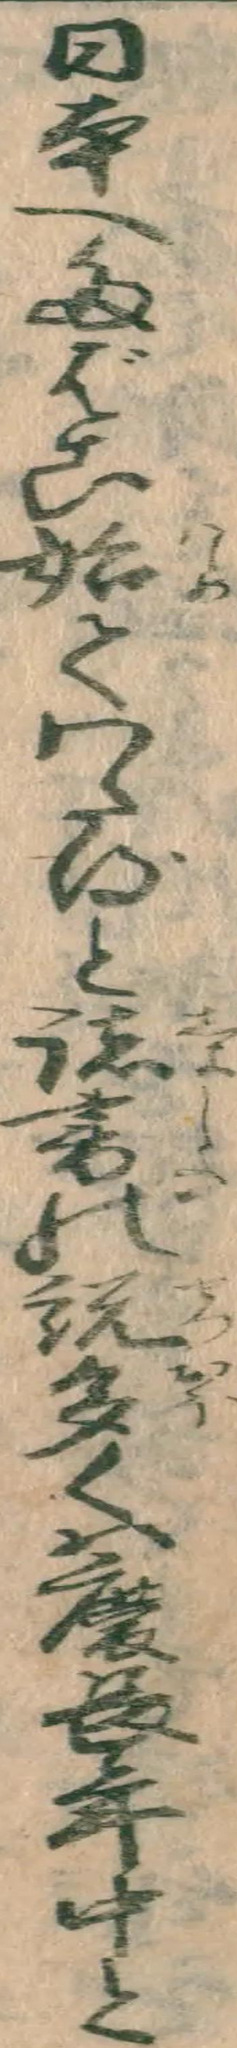日本へたばこ始てわたると諸書の説多くは慶長年中と
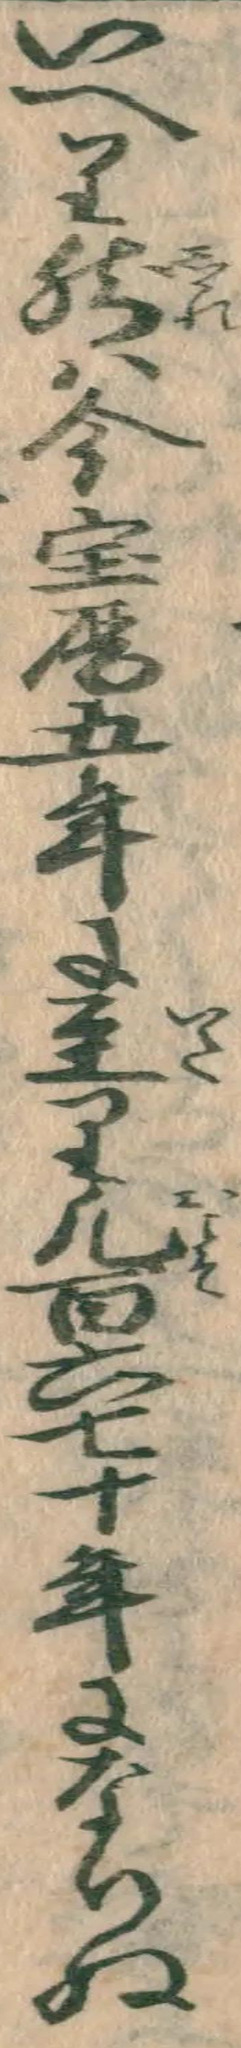いへり然は今宝暦五年に至り凡百六七十年になりぬ
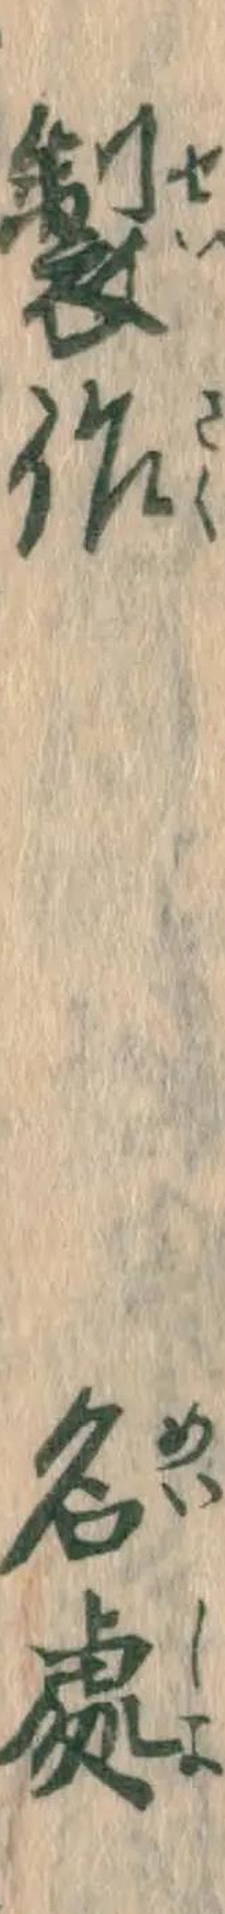製作名処
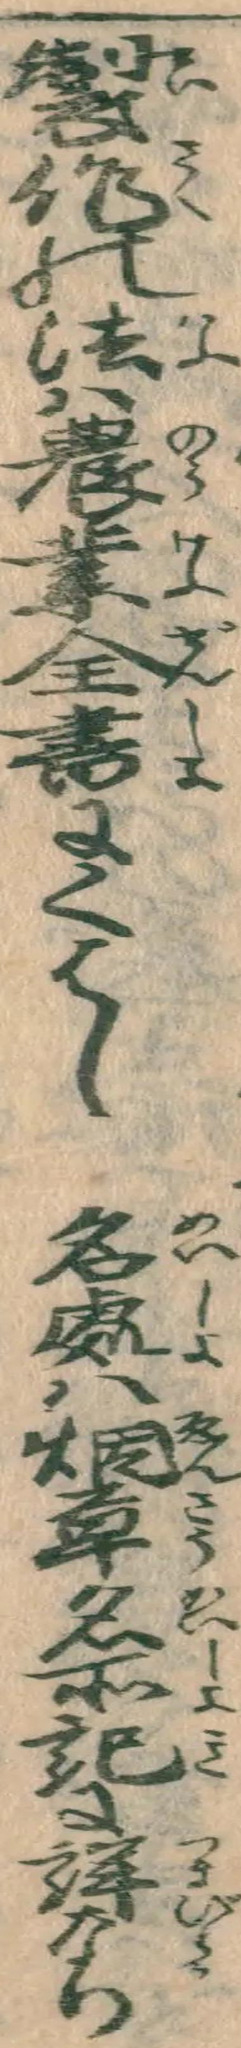製作の法は農業全書にくはし名処は烟草名所記に詳なり
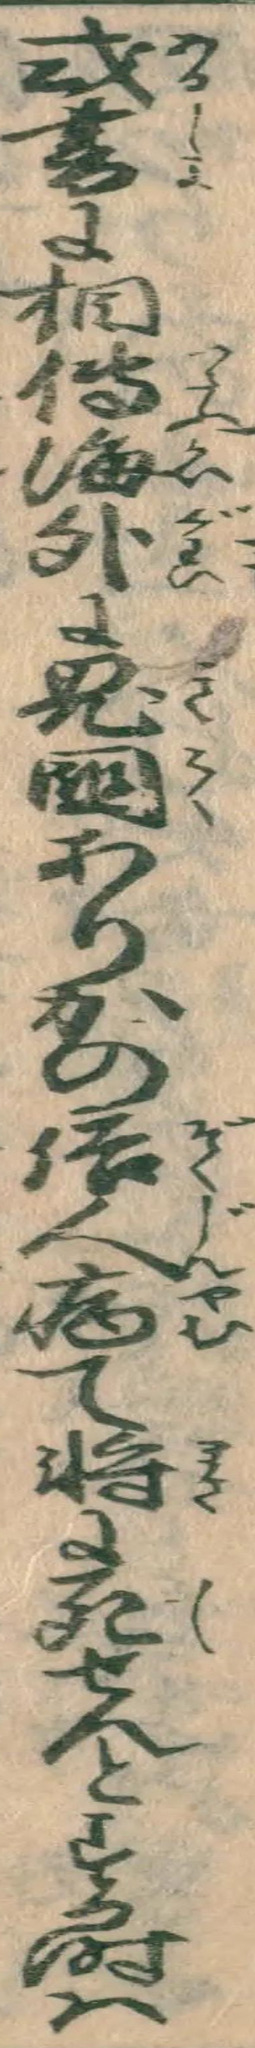或書に相伝海外に鬼国ありかの俗人病て将に死せんとする時は
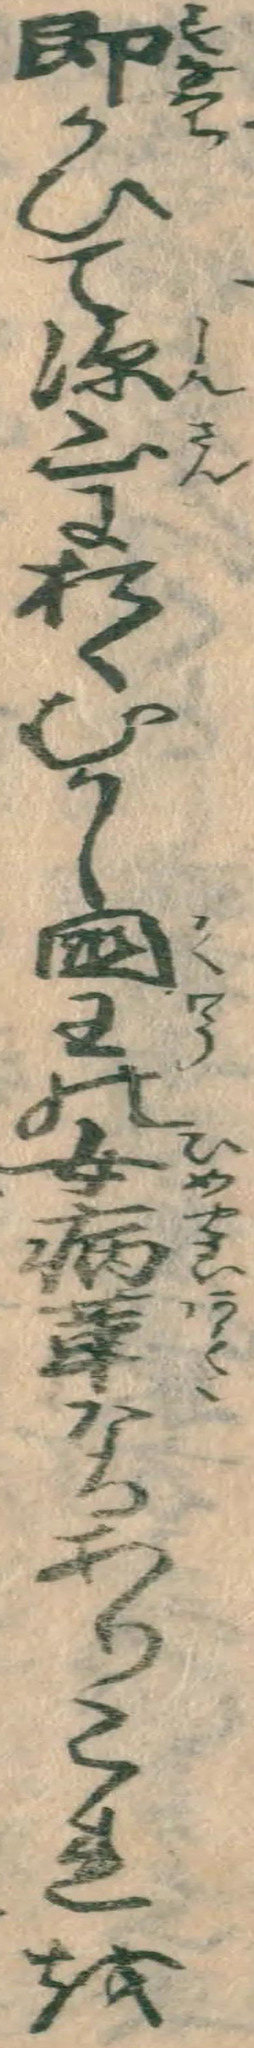即かひて深山におくむかし国王の女病革なるありこれを
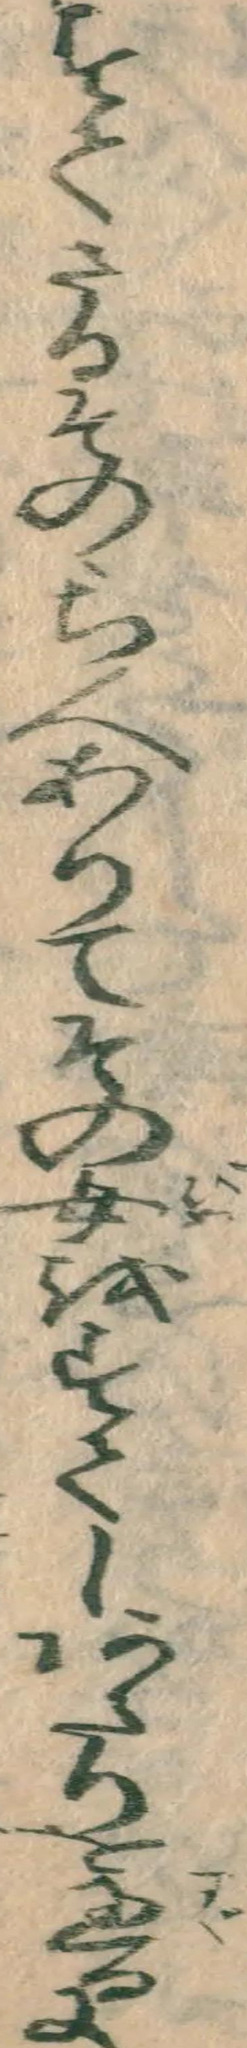すてさるそのゝち人ありてその女をすてしあたりを過るに
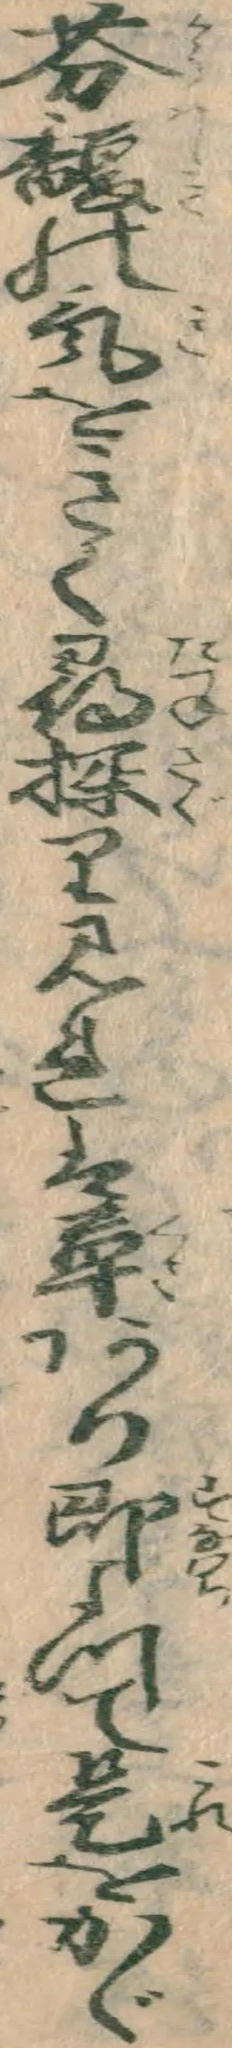芬馥の気をきく尋探り見れは草あり即よつて是をかぐ
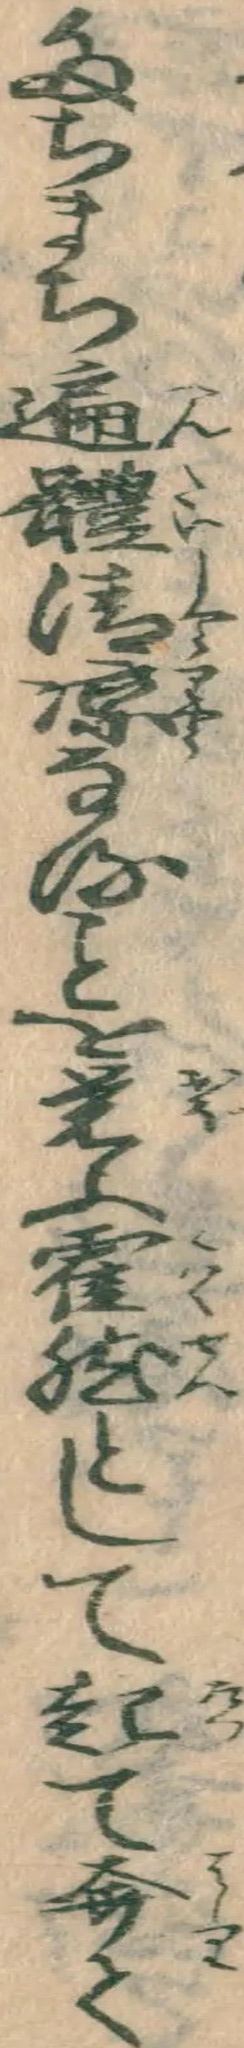たちまち遍体清涼なることを覚ふ霍然として起て奔て

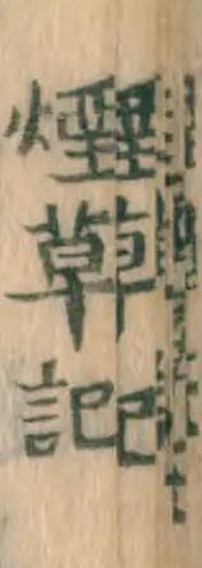煙草記
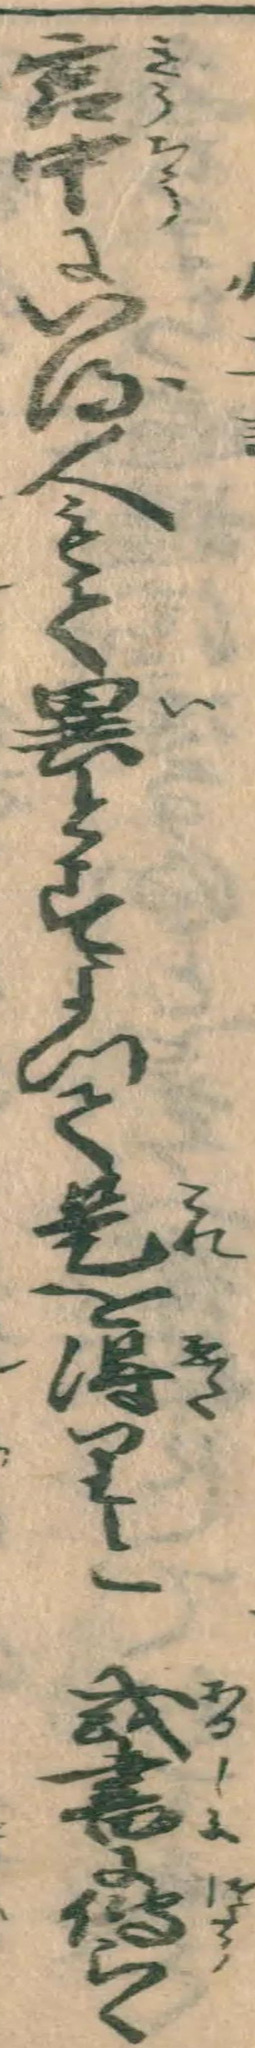宮中にいる人もて異とすよつて是を得りと或書に伝らく
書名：煙草記
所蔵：国立国会図書館 National Diet Library, JAPAN
